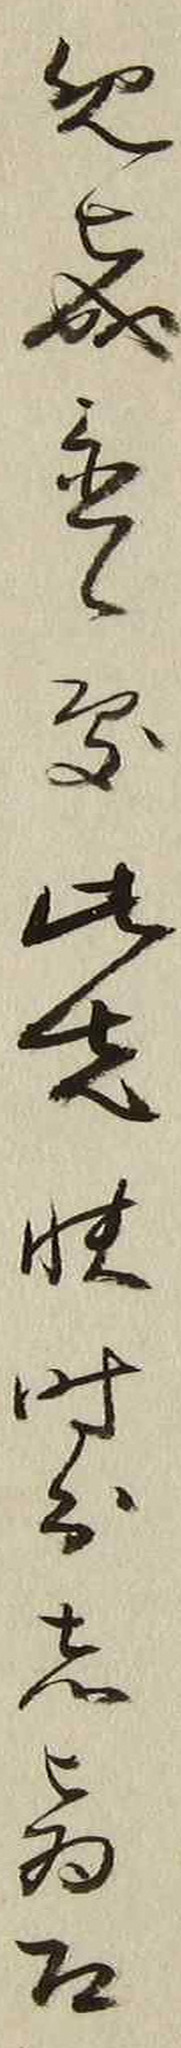免被成置候処此先快時分は被為召
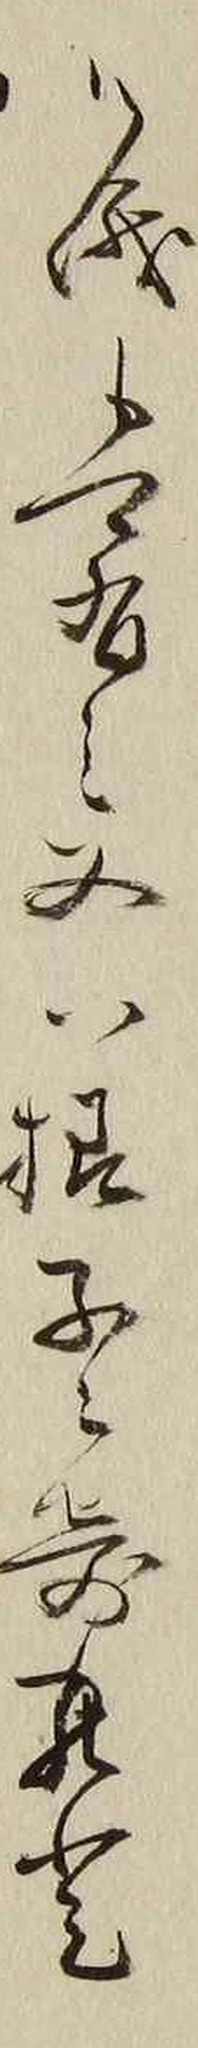候儀も可有之又は様子に寄罷登
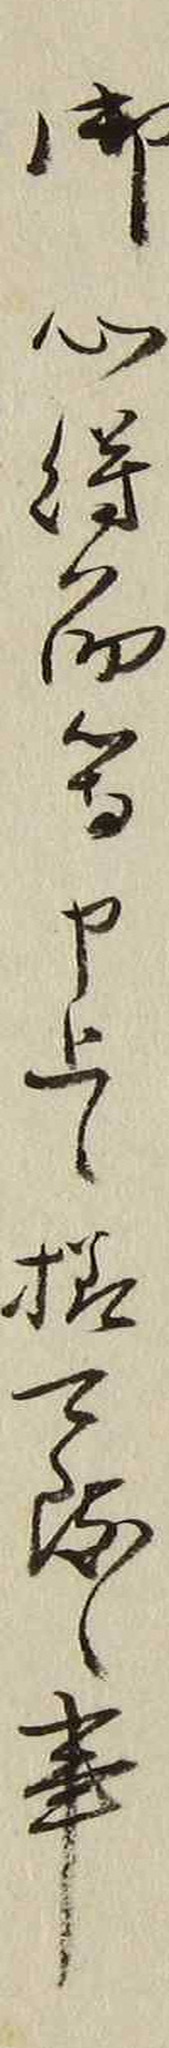御心得筋等申上候様可致候事
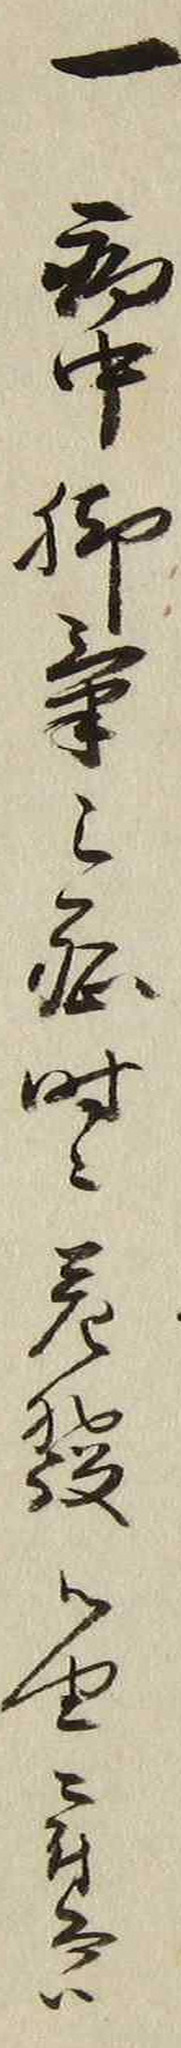一病中脚気之病時々差發候由に付而は
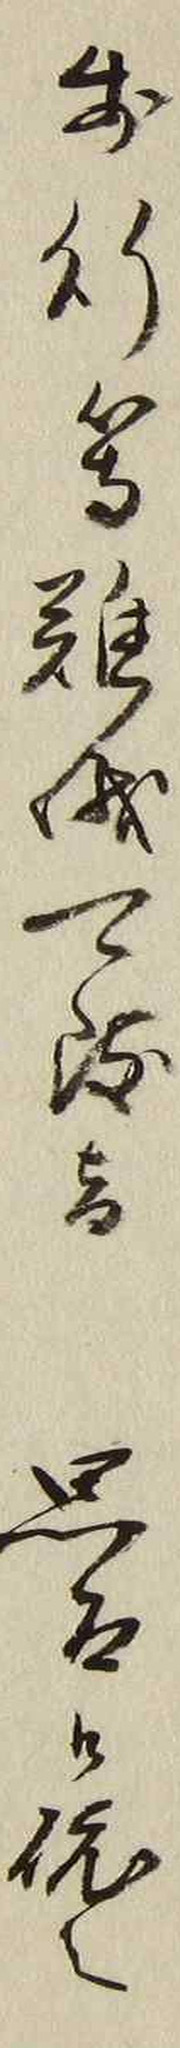歩行等難儀可致旨思召候依之
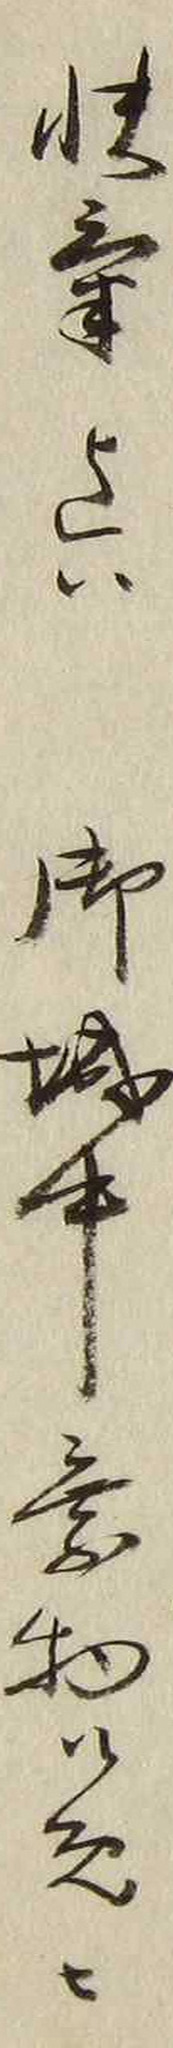快気迄は御城中乗物御免被
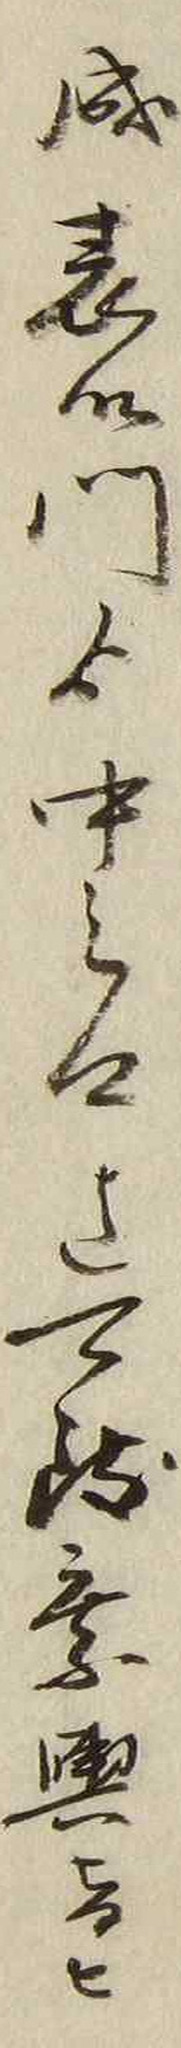成表御門ゟ中之口可致乗輿旨被

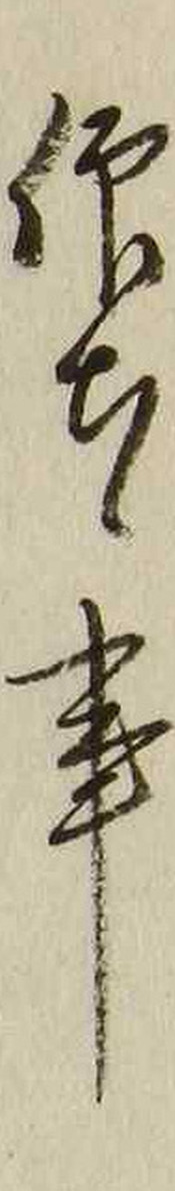仰出候事
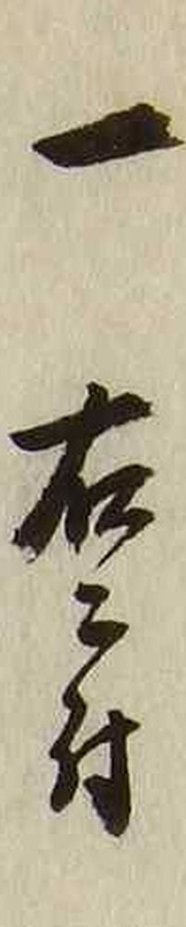一右に付
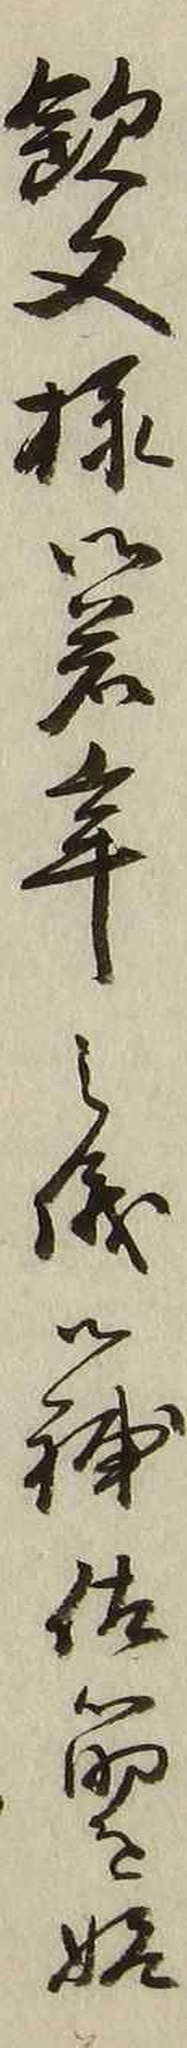欽文様御若年之儀御補佐筋を始
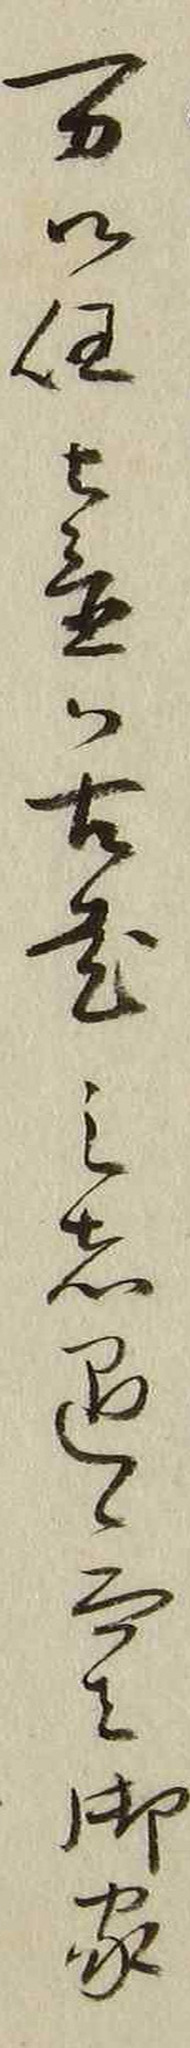万御任被置候古老之者追候而は御家
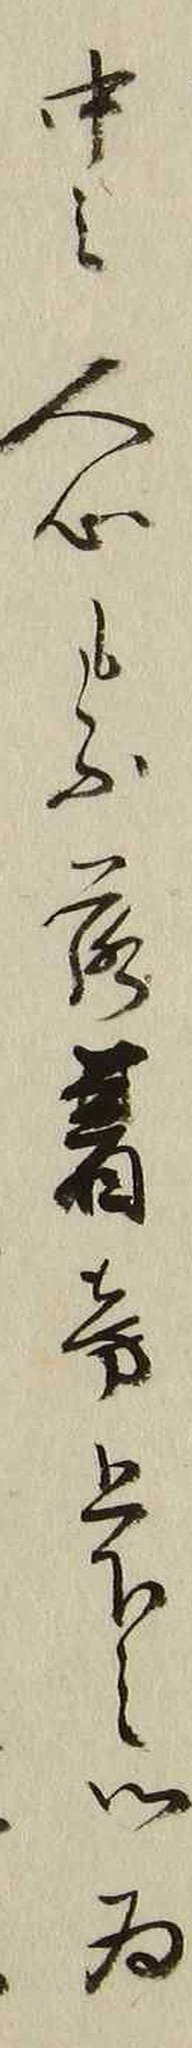中之人心も不落着旁上下之御為
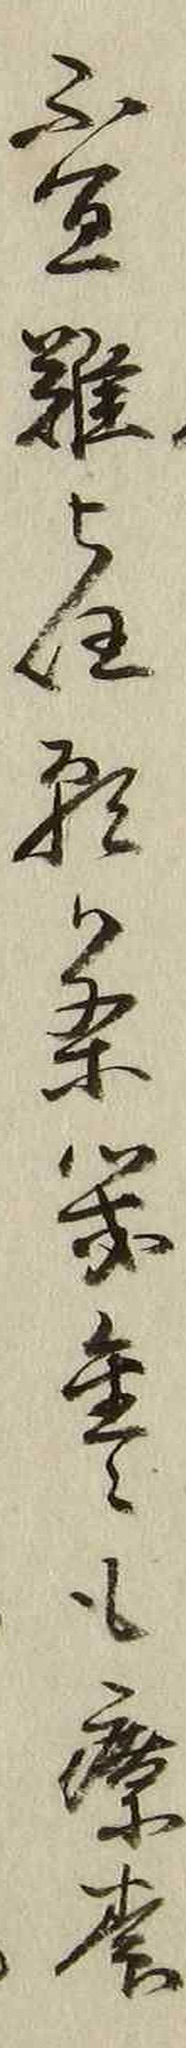不宜難被任願候条幾重にも療養
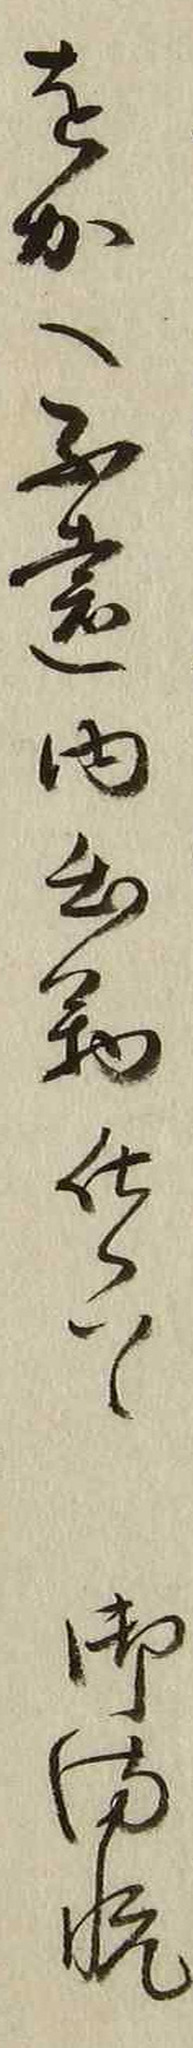を加へ不遠内出勤仕候はゝ御満悦
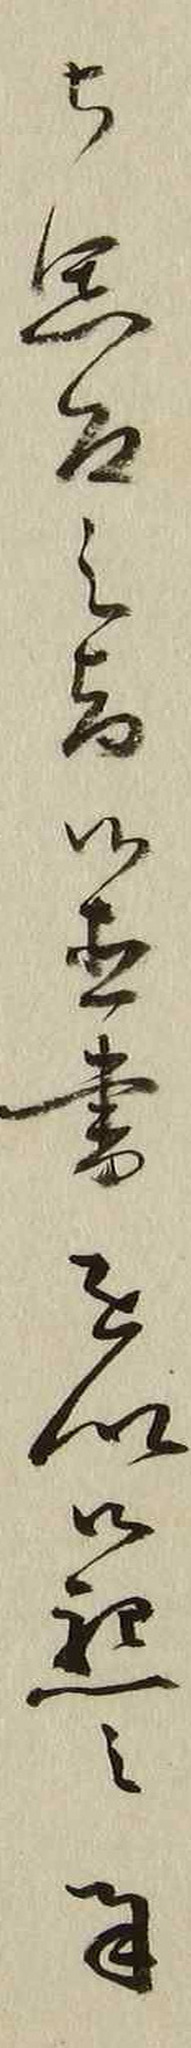被思召之旨御直書を以御懇之奉
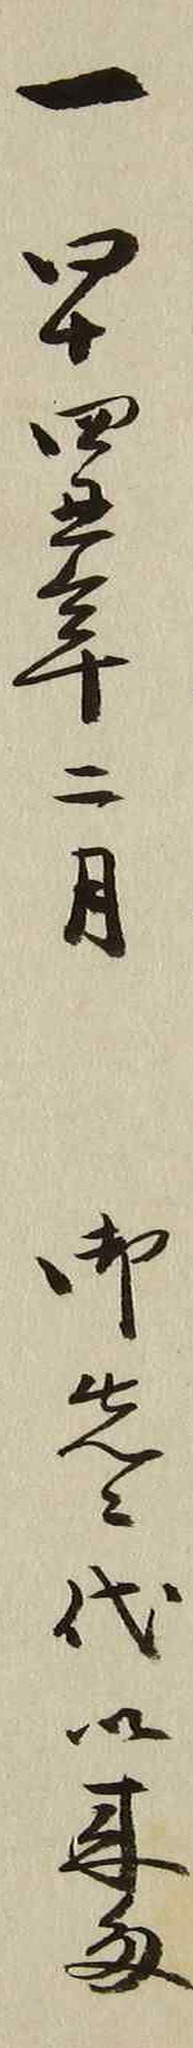一同十四丑年二月御先々代以来多
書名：諸士系譜　巻之292　き之部1
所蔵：会津若松市立会津図書館
